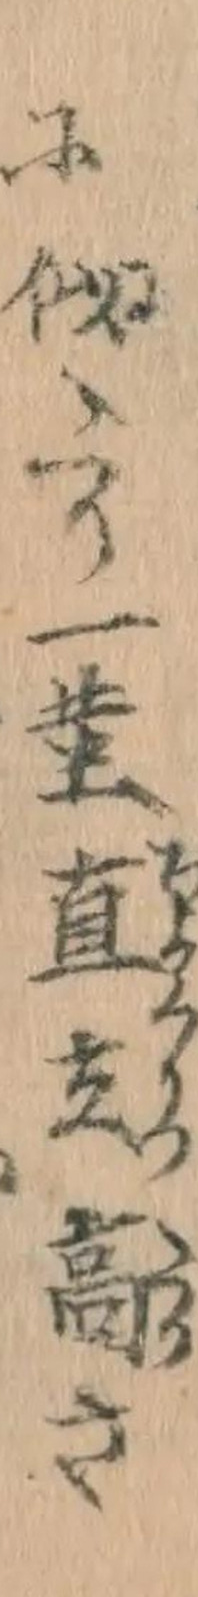に似たり一茎直立高さ
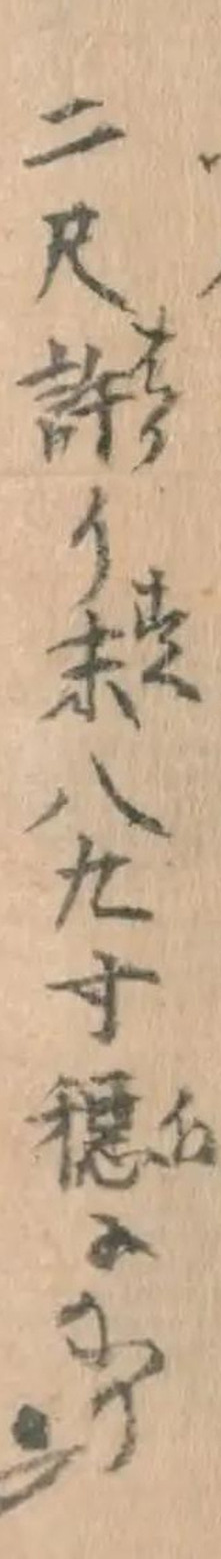二尺許り末八九寸穂になり
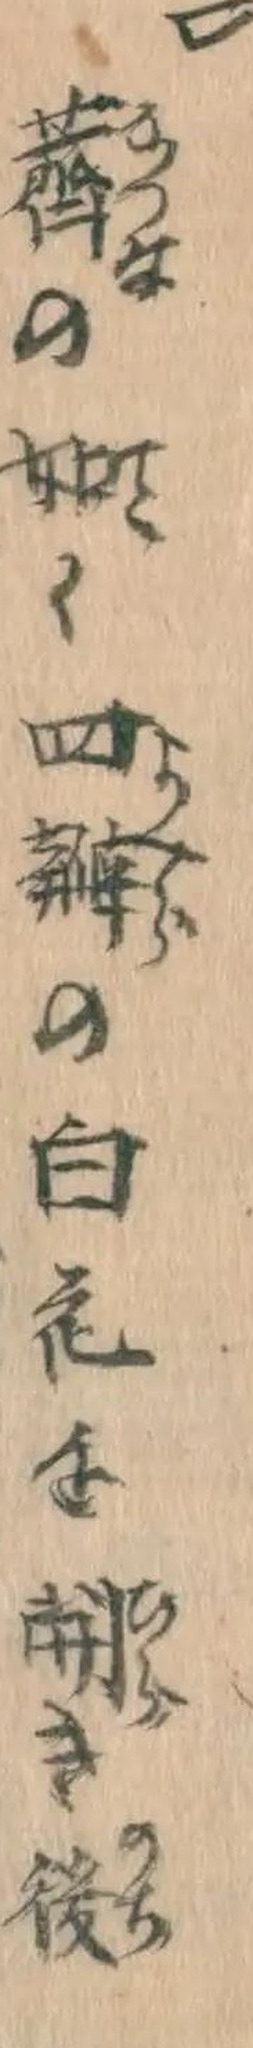薺の如く四弁の白花を開き後
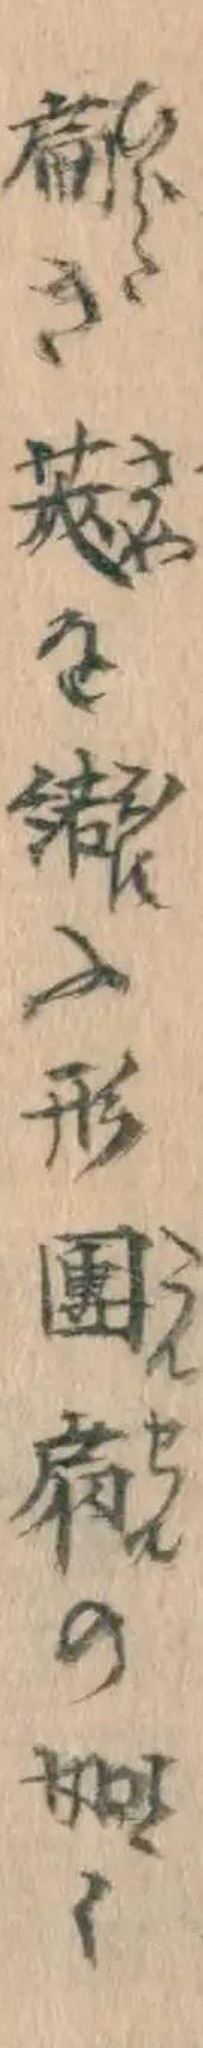扁き莢を結ふ形団扇の如く
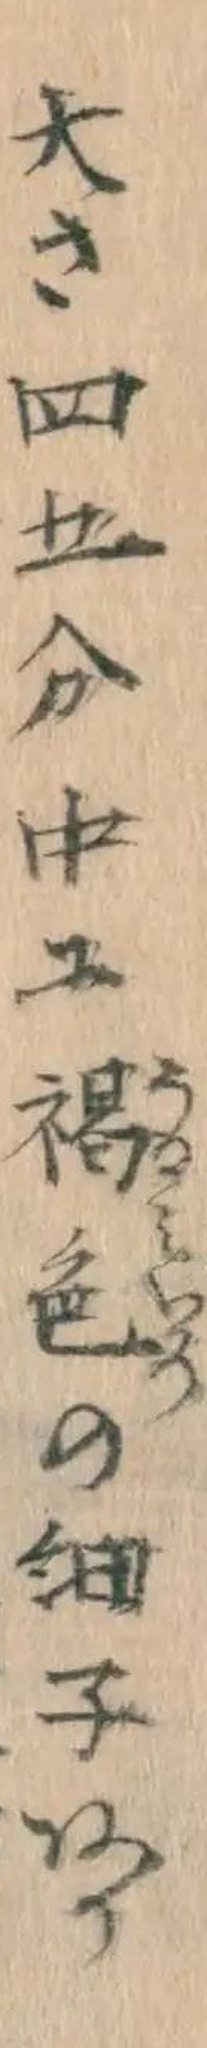大さ四五分中に褐色の細子あり
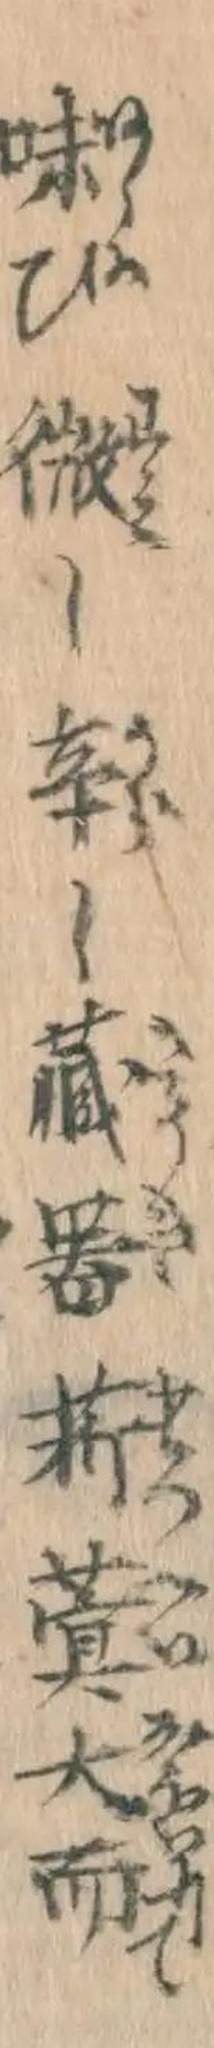味ひ微し辛し蔵器菥蓂大而
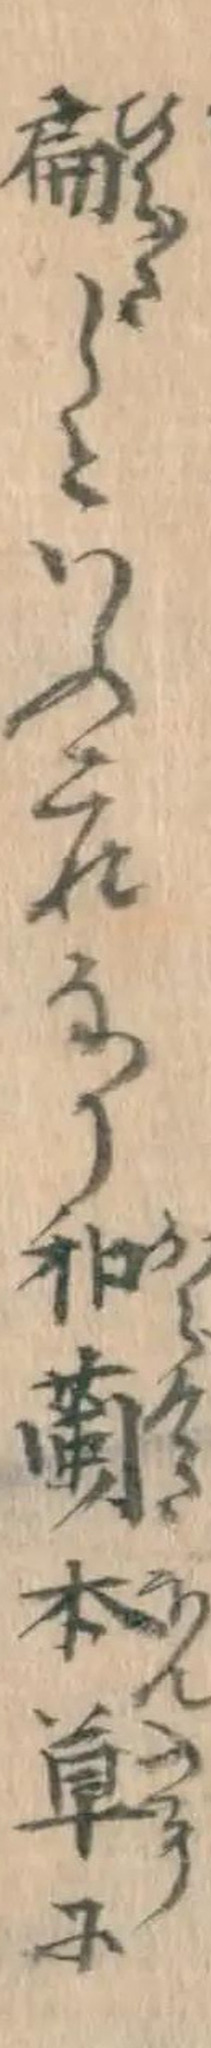扁しといふこれなり和蘭本草に
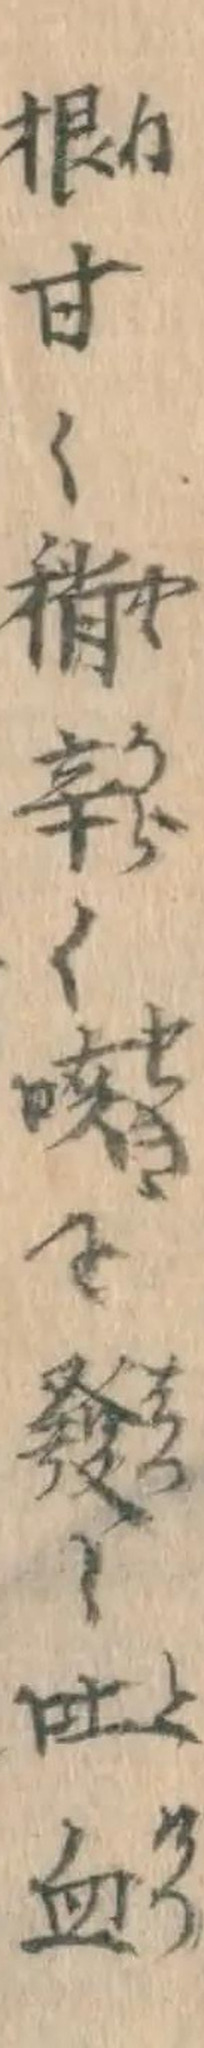根甘く稍辛く咳を発し吐血
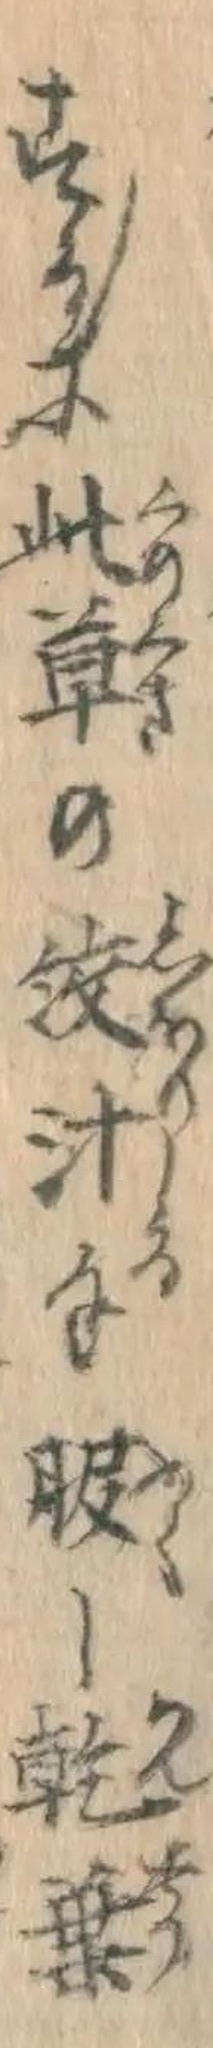するに此草の絞汁を服し乾葉
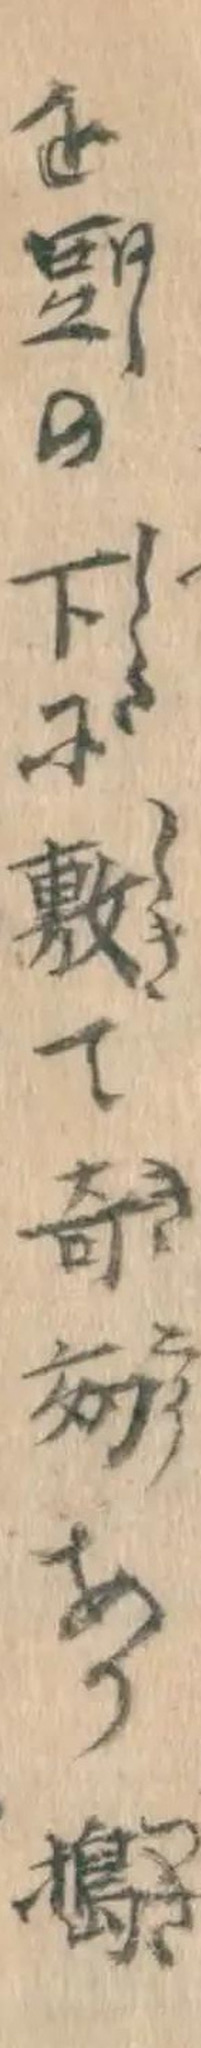を豆の下に敷て奇効あり搗
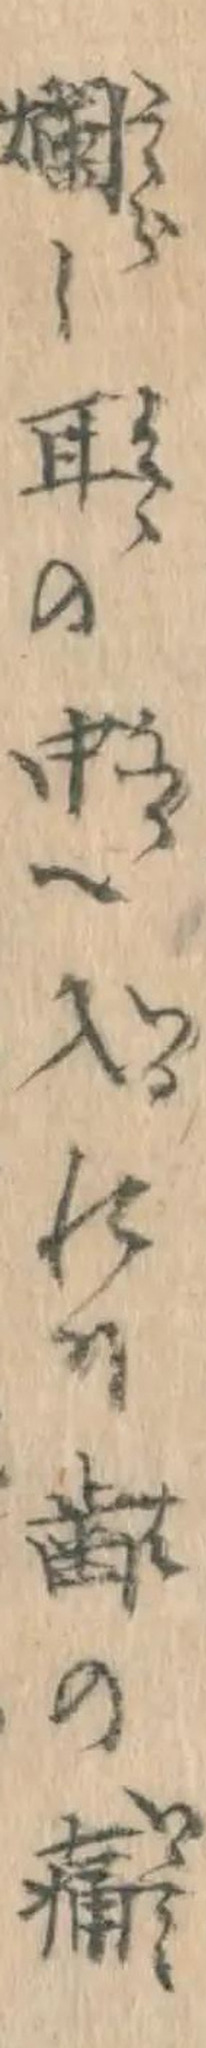爛し耳の中へ入れは歯の痛
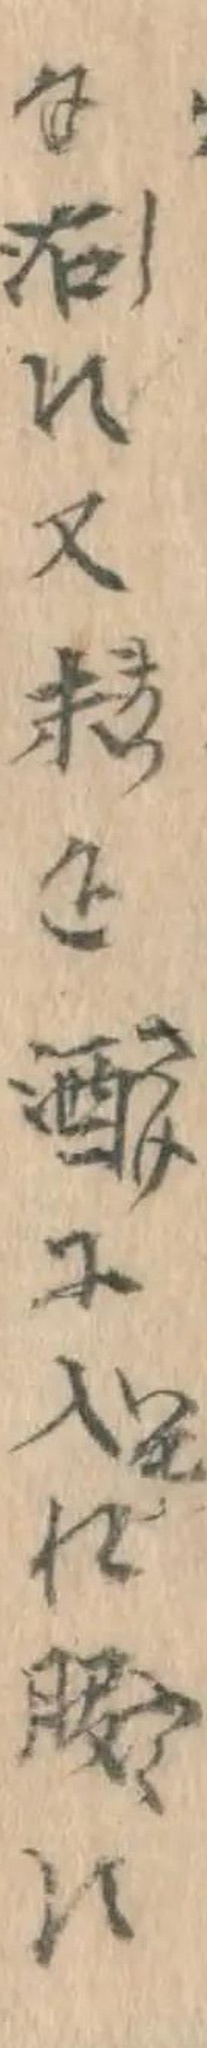を治す又末を酒に入れ服す
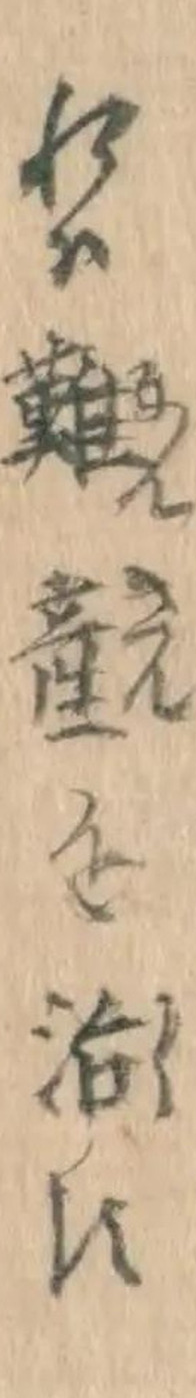れは難産を治す

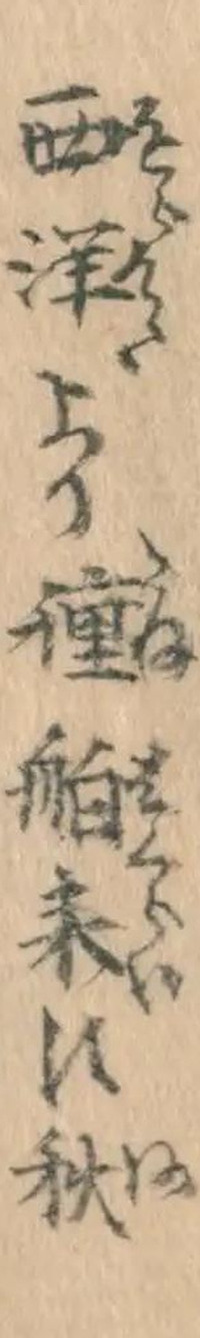西洋より種舶来す秋
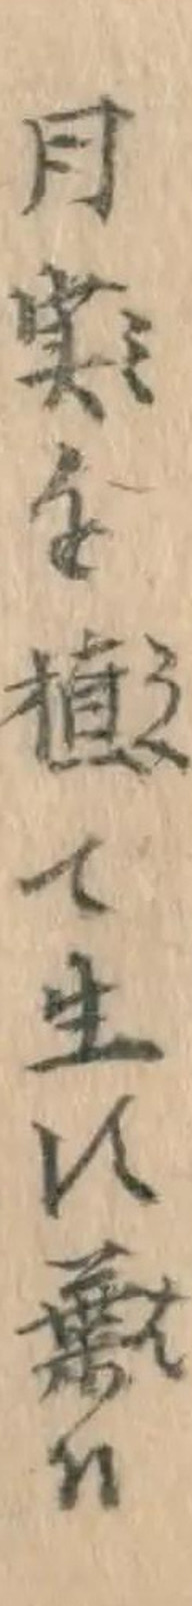月実を植て生す葉は
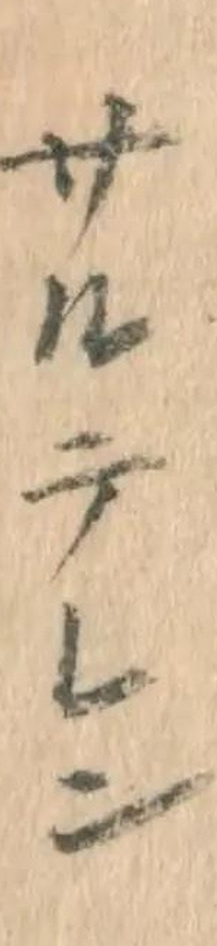サルテレン
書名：本草図譜. 巻46-48
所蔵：国立国会図書館 National Diet Library, JAPAN
